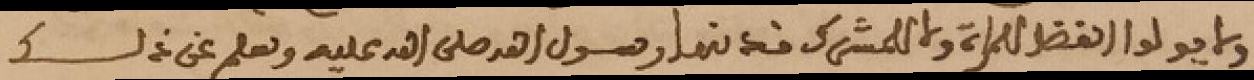ولا يولوا القضا للمراة ولا للمشرك قد نها رسول الله صلى الله عليه وسلم عن ذلك
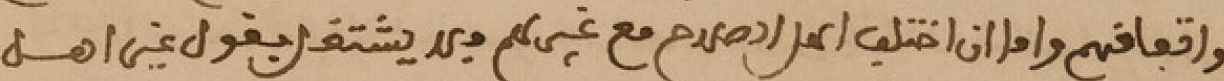واتفاقهم واما ان اختلف اهل الصلاح مع غيرهم فهو يشتغل بقول غير اهل
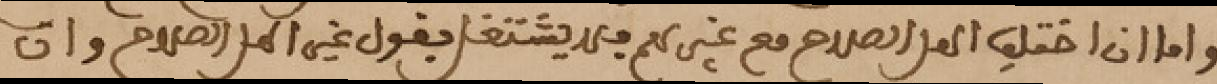واما ان اختلف اهل الصلاح مع غيرهم فهو يشتغل بقول غير اهل الصلاح وان
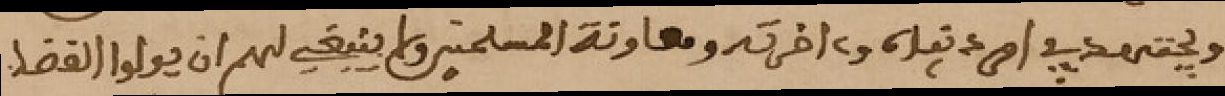ويجتهد في امر دنياه وءاخرته ومعاونة المسلمين ولا ينبغي لهم ان يولوا القضا
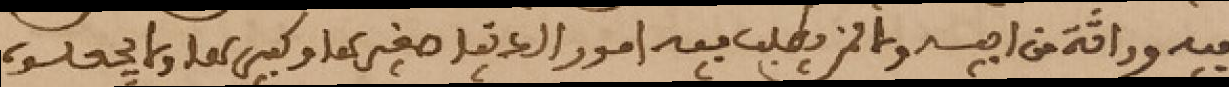فيه وراثة من اجير ولا من يطلب بعد امور الدنيا صغيره او كبيره ولا يجعلوه
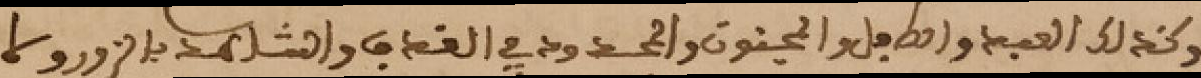وكذلك العبد والطفل والمجنون والمحدود في القذف والشاهد بالزور ولا
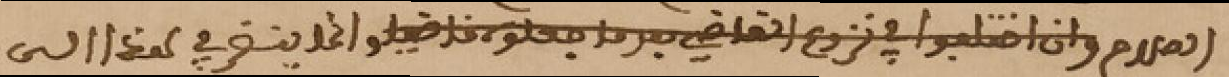اهل الصلاح وان اختلفوا في نزوع القاضي بعدما جعلوه قاضيا وانحا ينضر في هذا الى
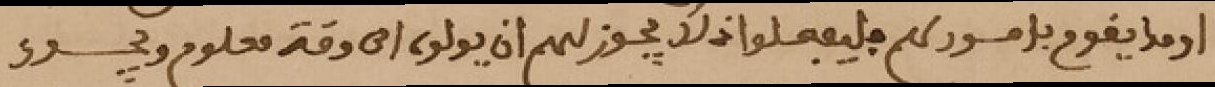او ما يقوم بامورهم فليفعلوا ذلك يجوز لهم ان يولوه الى وقت معلوم ويجوز
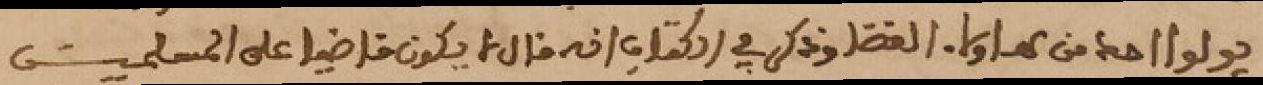يولوا احد من هاولاء ولا القضا وذكر في الكتاب انه قال لا يكون قاضيا على المسلمين
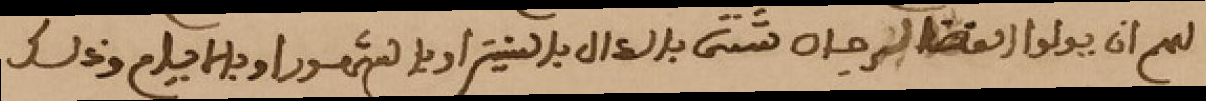لهم ان يولوا القضا لرجال شتى بالدال بالسنين او بالشهور او بالايام وذلك
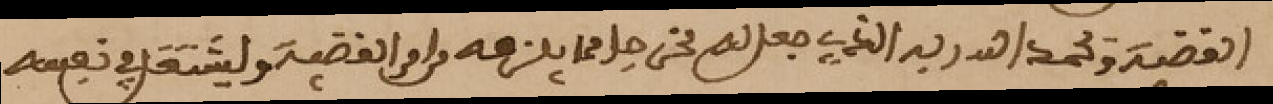القضية ويحمد الله ربه الذي جعل له مخرجا مما يلزمه من امر القضية وليشتغل في نفسه
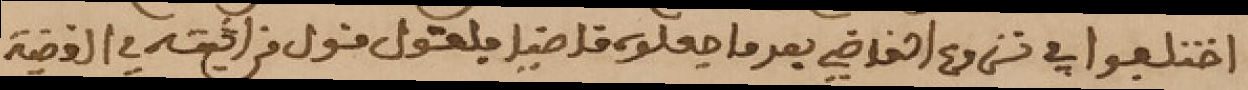اختلفوا في نزوع القاضي بعدما جعلوه قاضيا فلقول قول من اتيته في القضية
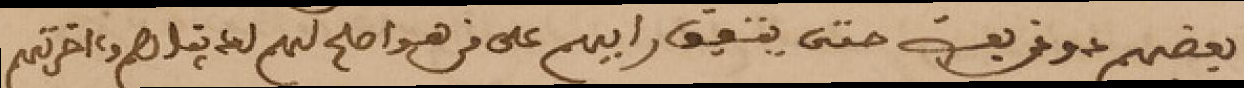بعضهم دون بعض حتى يتفق رايهم على من هو اصلح لهم لدنياهم وءاخرتهم
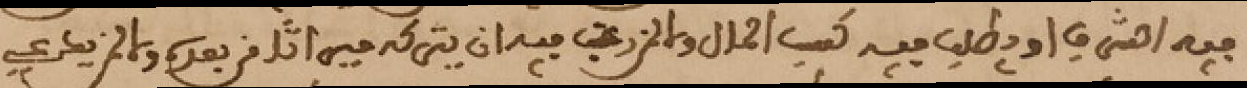فيه الشرف او يطلب فيه كسب المال ولا من رغب ميدان يتركه حي اثر من بعده ولا من يدعي
